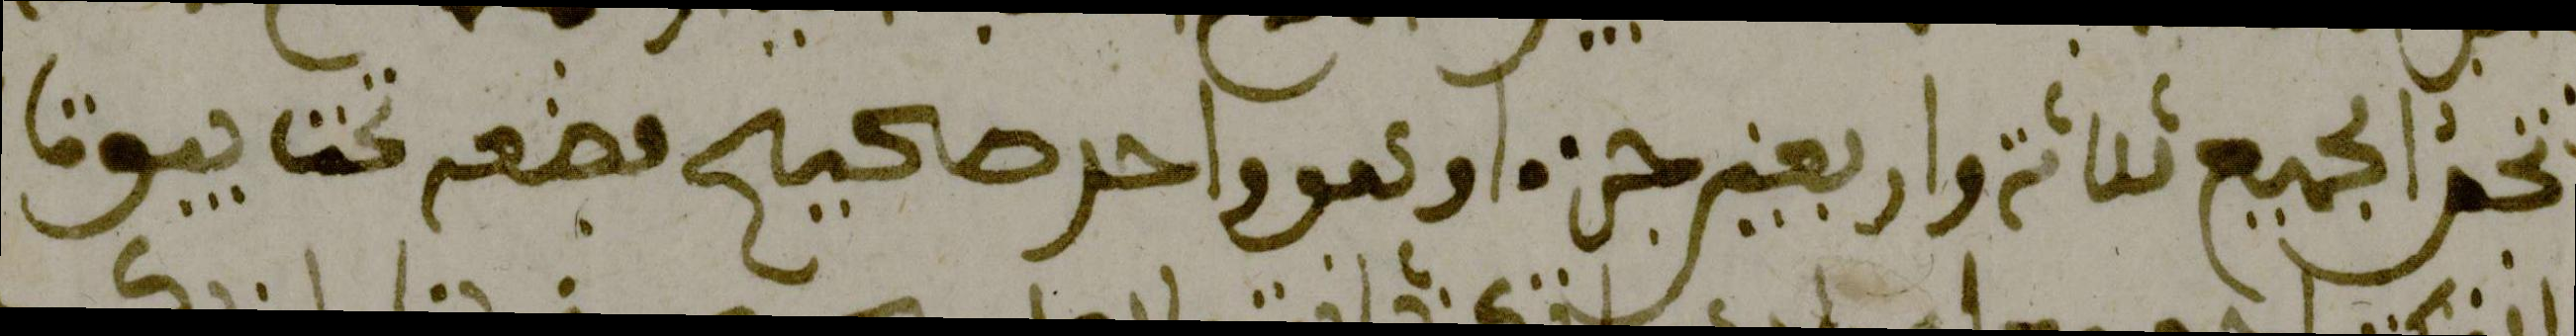تجد الجميع ثلاثة واربعين جزءا وهو واحد صحيح فضعه تحت بيوت
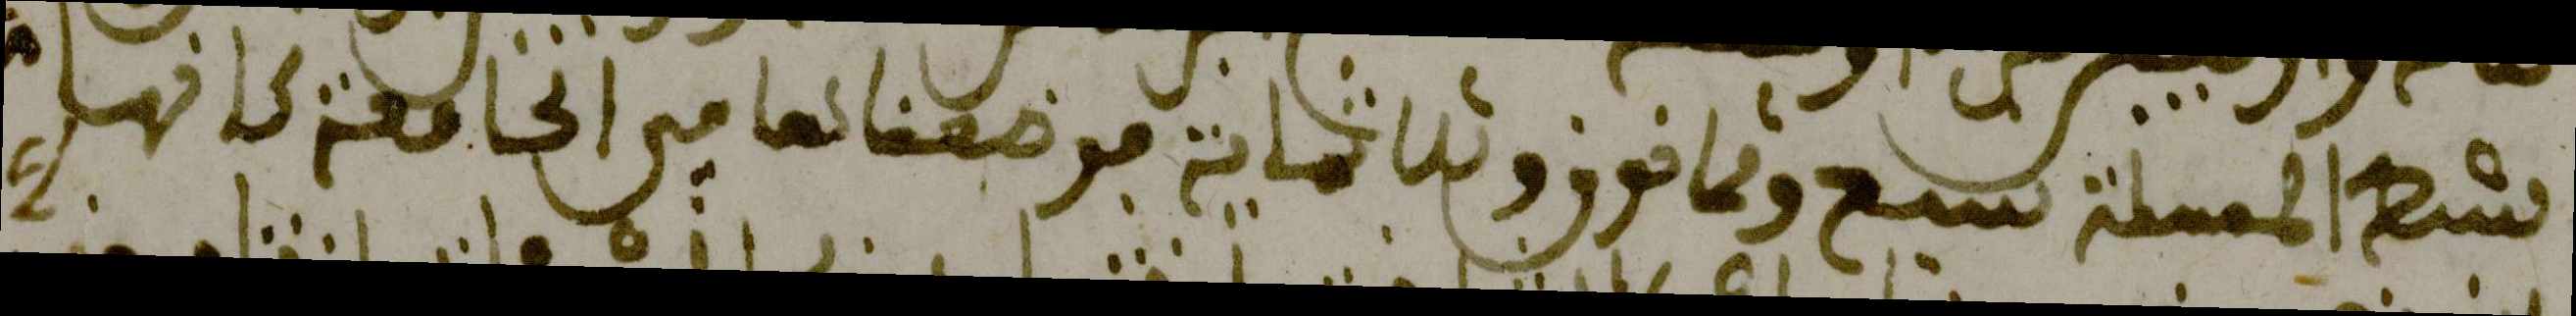بسْط المسْلة سبع وثمانون وثلاثماية فوضعناها في الجامعة كانها
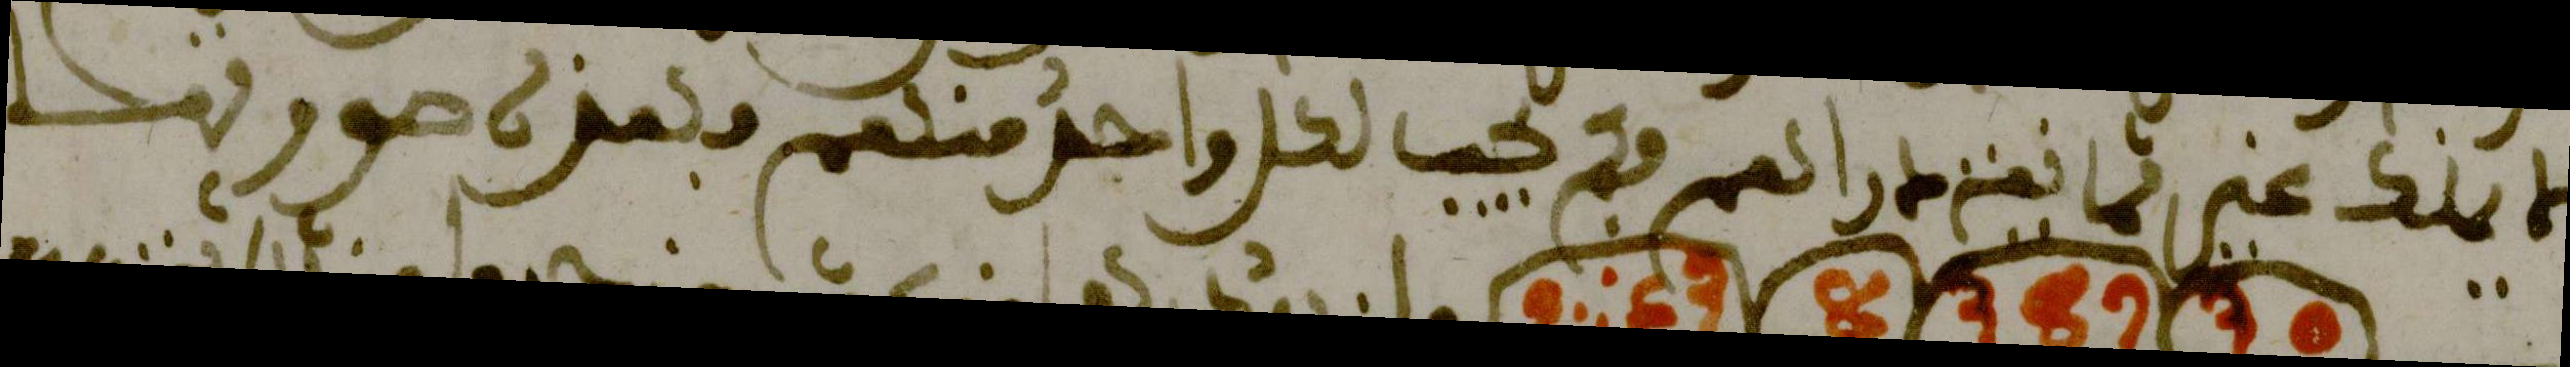لا يملك غير ثمانية درراهم فكم يجب لكل واحد منهم فهذه صورتها
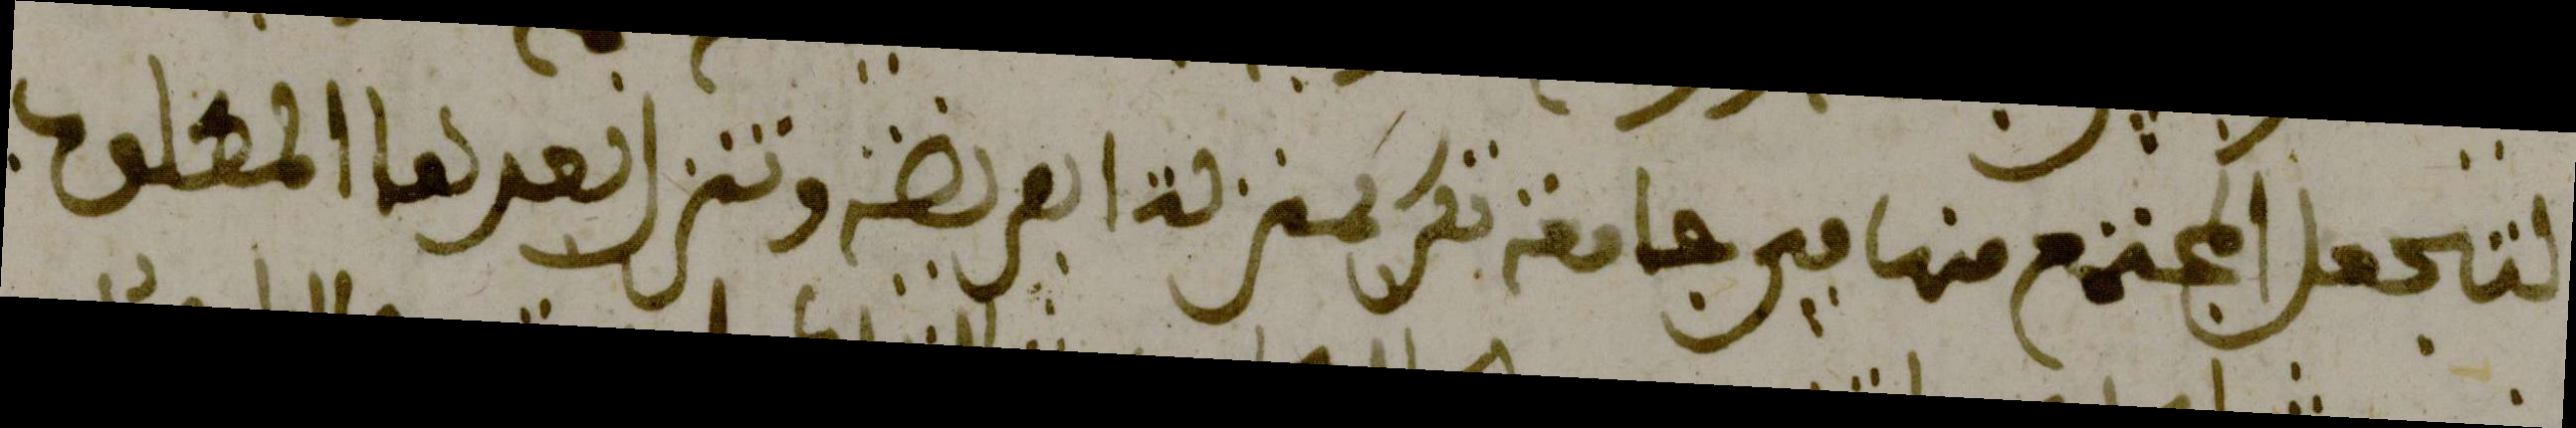لتجعل المجتمع منها في جامعة تكن بمنزلة الفريضة وتنزل بعدها المطلوب
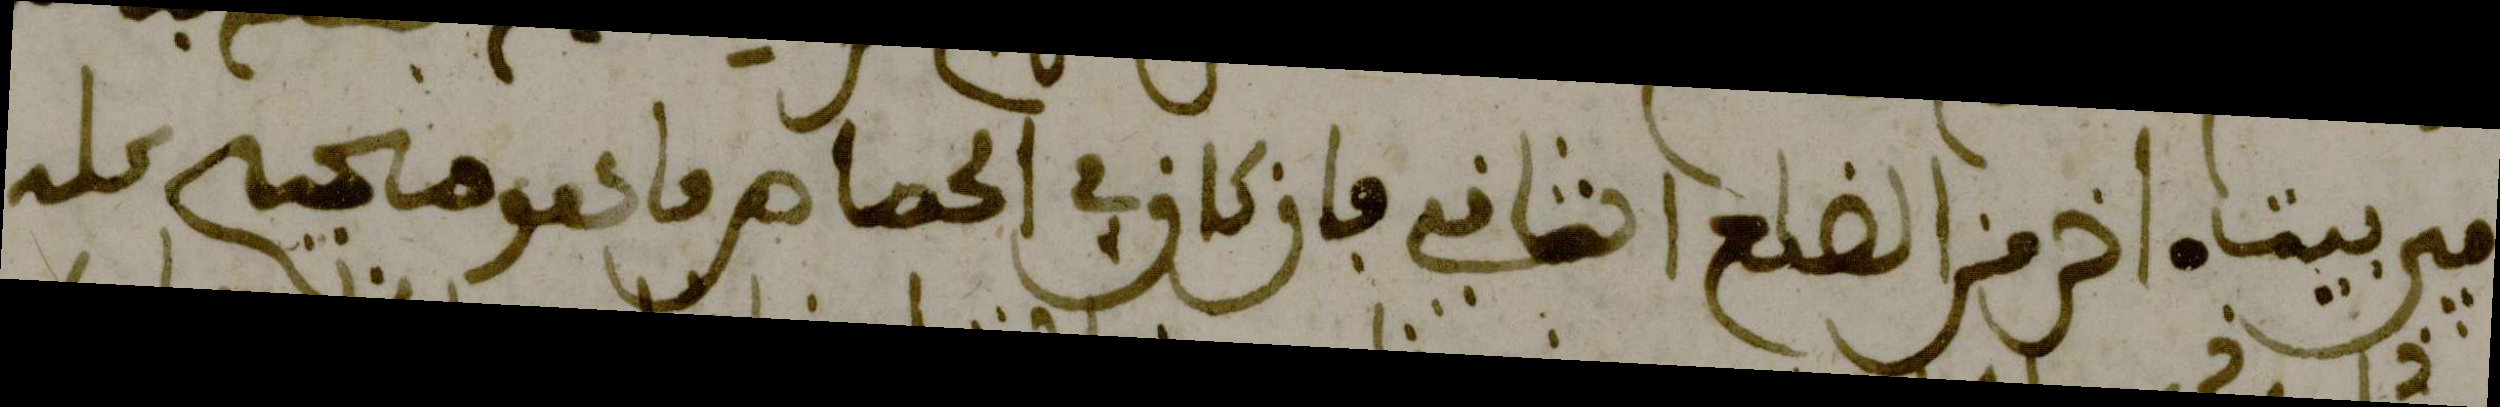في بيت اخر من الضلع الثاني فان كان في الحصاص ما هو صحيح كله
